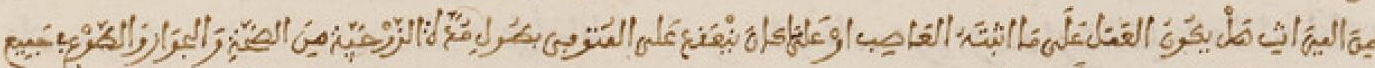من الميراث هل يكون العمل على ما اثبته العاصب او على ما كان ينعقد على المتوفى بطول مدة الزوجية من الصحة والجواز والطوع في جميع
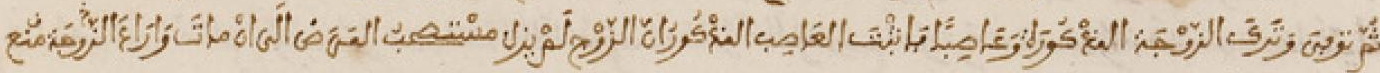ثم توفي وترك الزوجة المذكورة وعاصبا فاثبت العاصب المذكور ان الزوج لم يزل مستصحب المرض الى ان مات واراد الزوجة منع
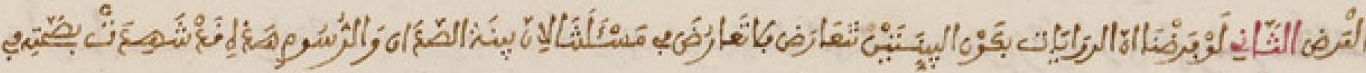المرض الثاني لو فرضنا ان الروايات بكون البينتين تتعارض فلا تعارض في مسألتنا لان بينة الصداق والرسوم هذه قد شهدت بصحته في
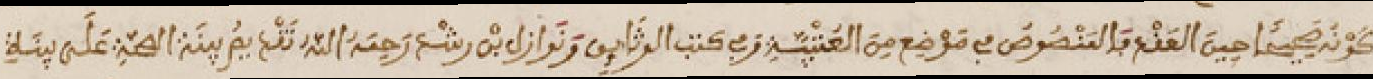كونه صحيحا حين العقد فالمنصوص في موضع من العتبية و في كتب الوثائق ونوازل ابن رشد رحمه الله تقديم بينة الصحة على بينة
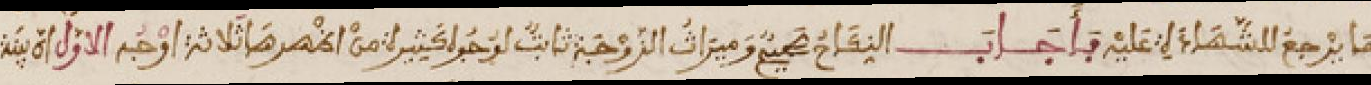ما يرجع للشهادة عليه فأجاب النكاح صحيح وميراث الزوجة ثابت لوجوه كثيرة من اظهرها ثلاثة اوجه الأول ان بينة
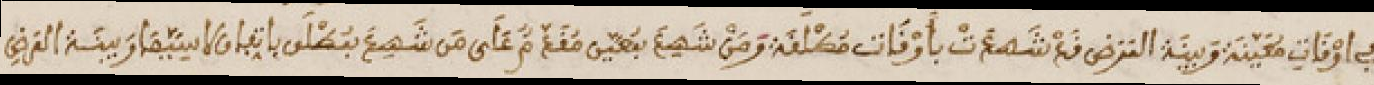في اوقات معينة وبينة المرض قد شهدت باوقات مطلقة ومن شهد بمعين مقدم على من شهد بمطلق باتفاق لاسيما وبينة المرض
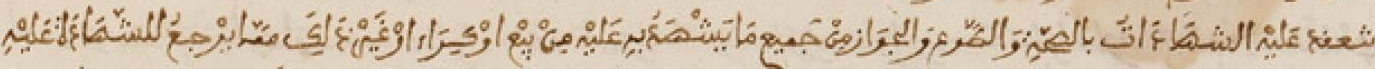تنعقد عليه الشهادات بالصحة والطوع والجواز من جميع ما يشهد به عليه من بيع اوكراء اوغير ذلك مما يرجع للشهادة عليه
